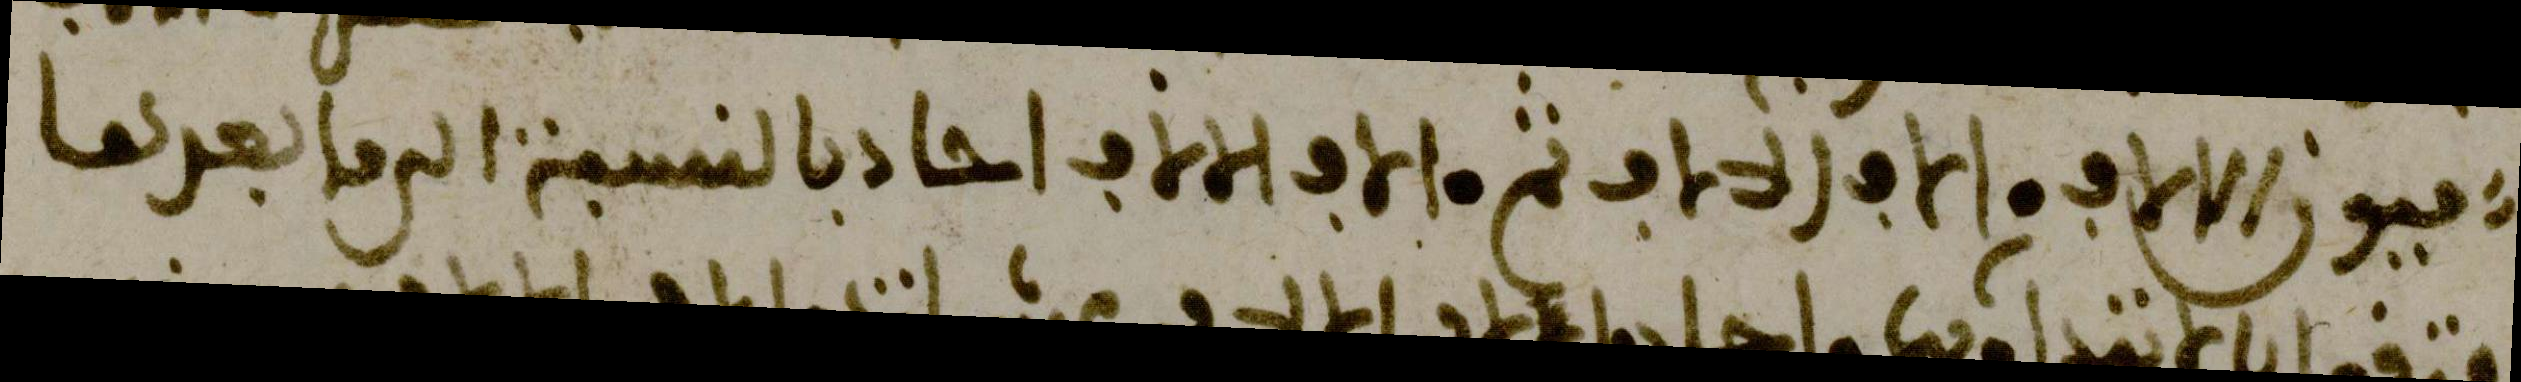ميون الالاف ءالاف الالاف ثم ءالاف الالاف احاد بالنسبة الى ما بعدها
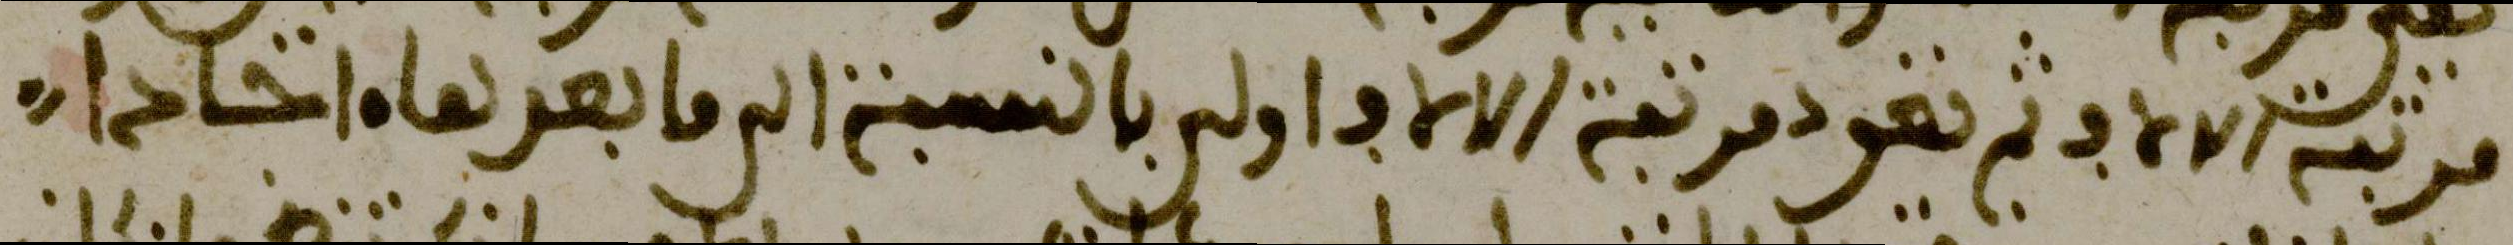مرتبة الالاف ثم تعود مرتبة الالاف اولى بالنسبة الى ما بعدها ءاحادا
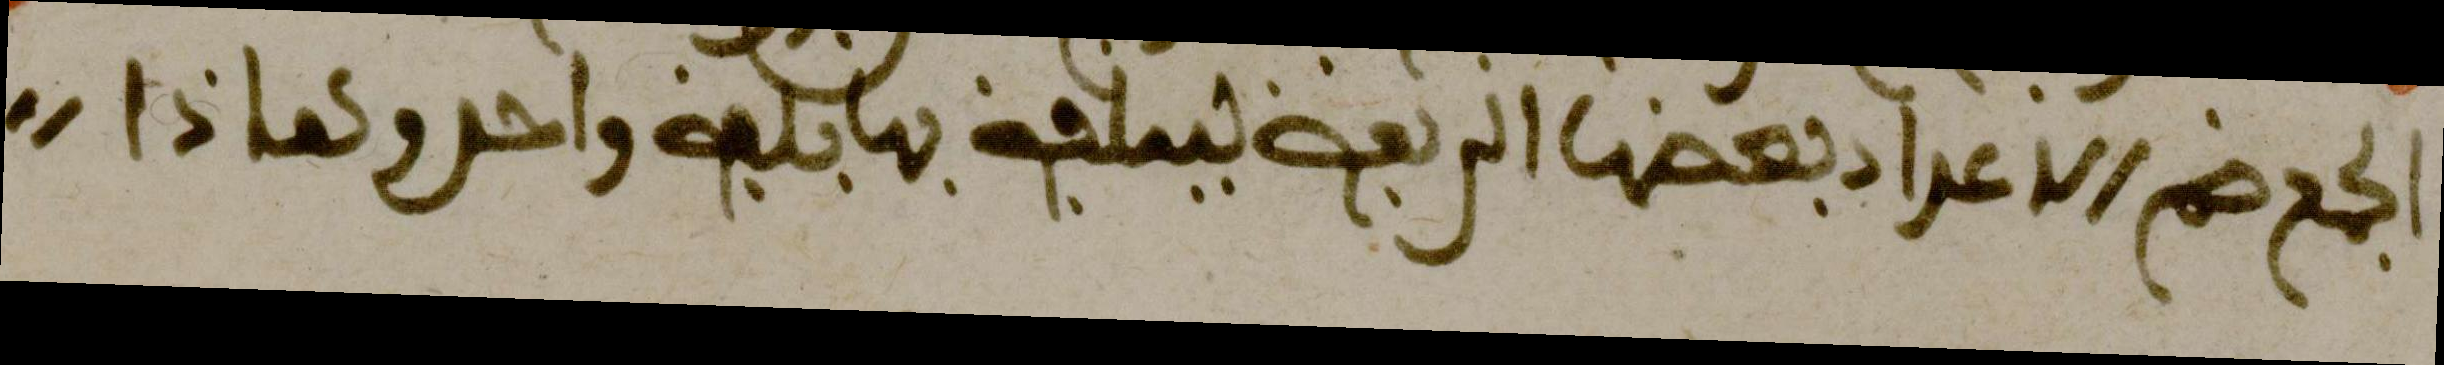الجمع ضم الاعداد بعضها الى بعض ليىلفض بها بلفض واحد وهاذا
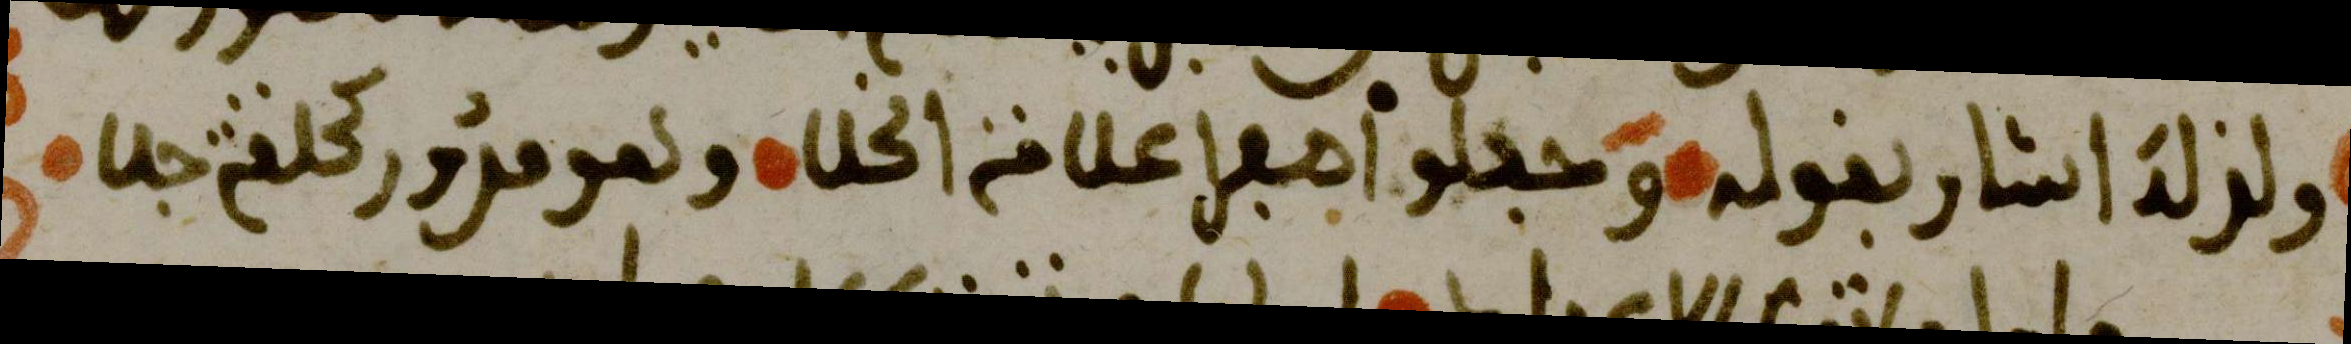ولذلك اشار بقوله وَجعلوا صفرا علامة الخلا وهو مدور كحلقة جلا
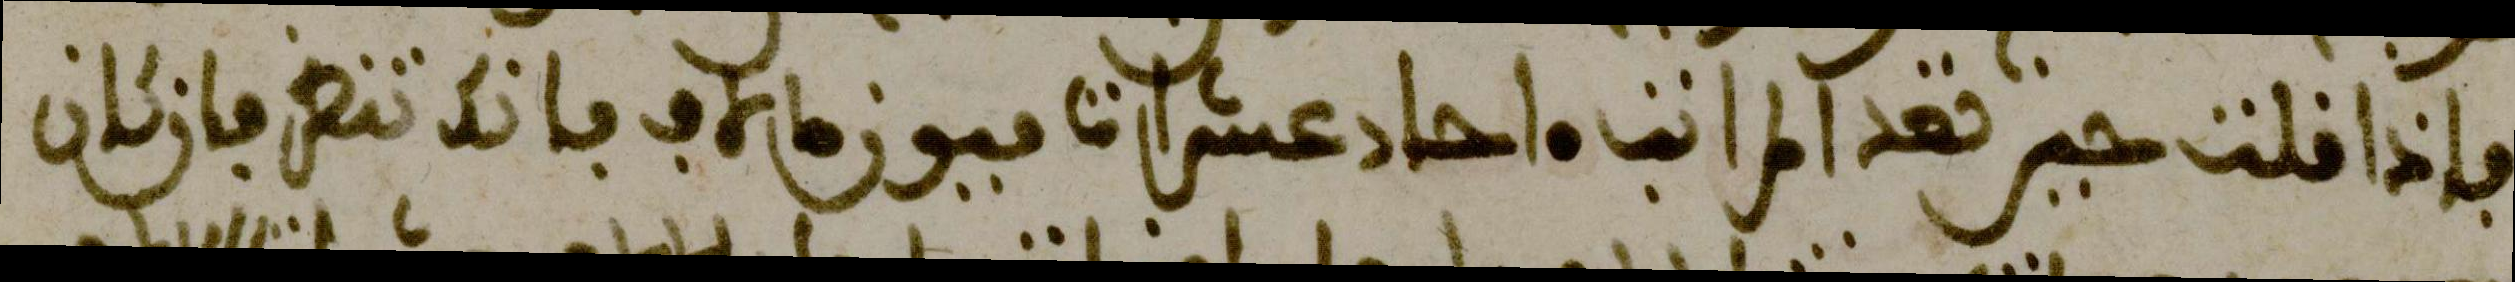فاذا قلت حين تعد المراتب ءاحاد عشرات ميون مالاف فانك تنظر فان كان
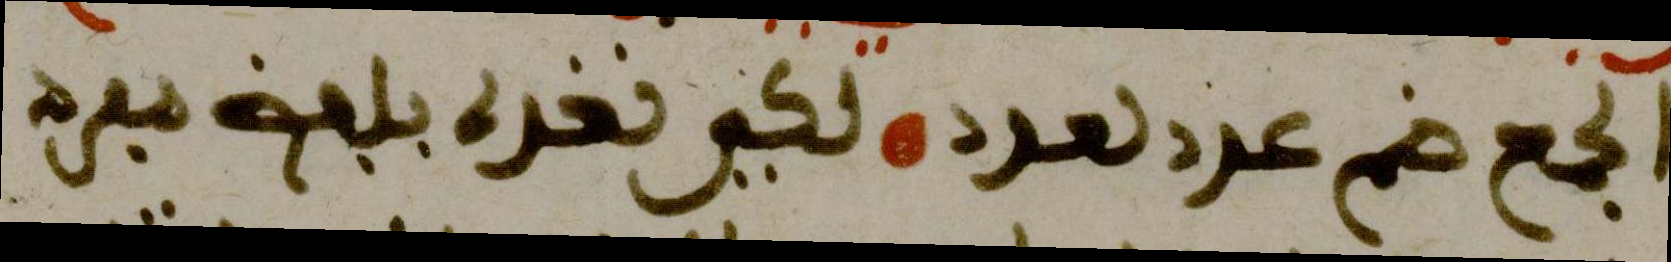الجمع ضم عدد العدد لكي تعده بلفض مفرد
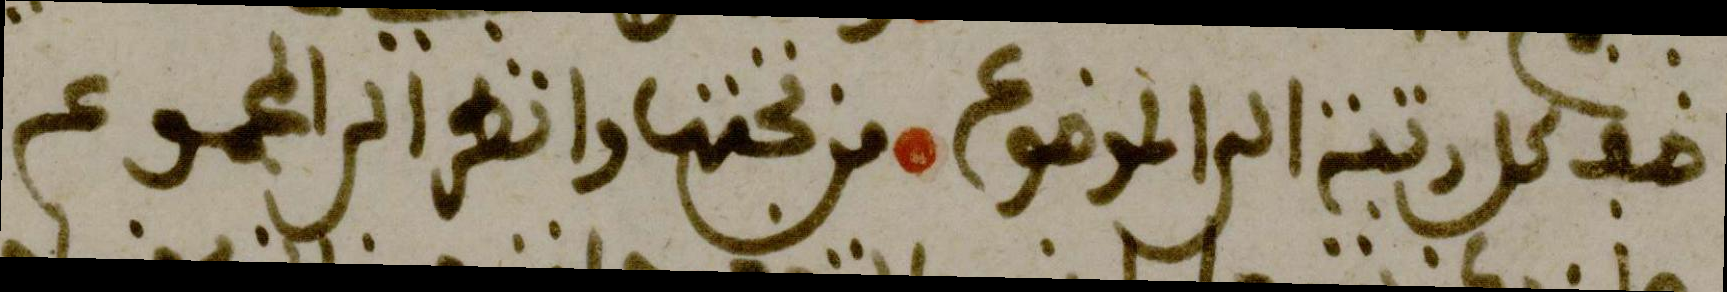ضف كل رتبة الى الموضوع من تحتها وانظر الى المجموع
